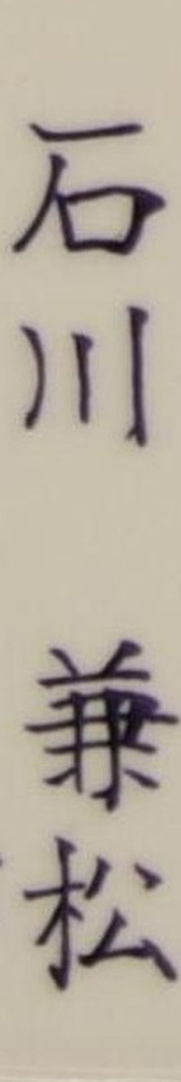石川兼松

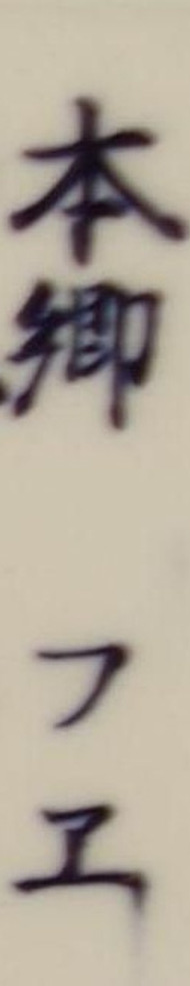本郷フヱ
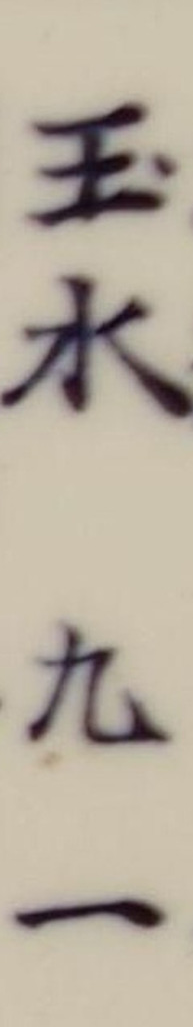玉水九一
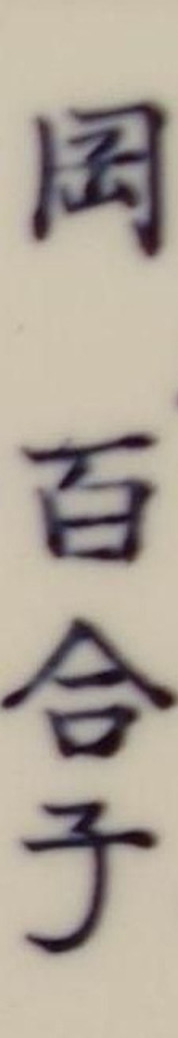岡百合子
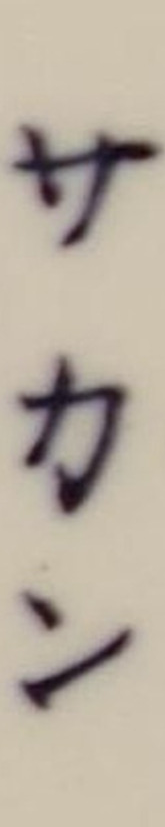サカン
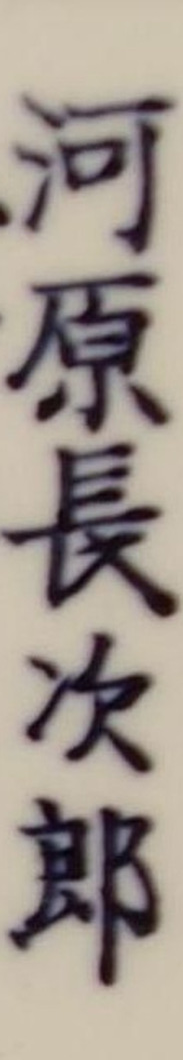河原長次郎
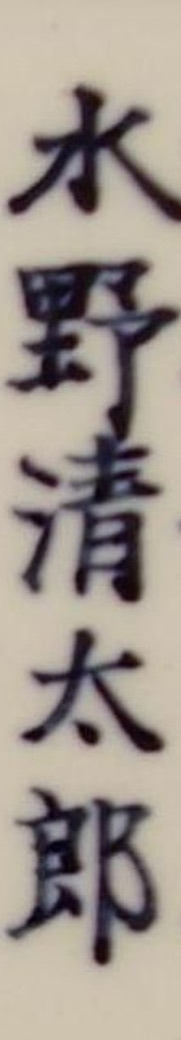水野清太郎
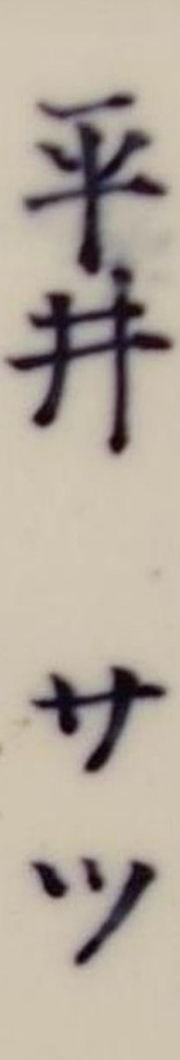平井サツ
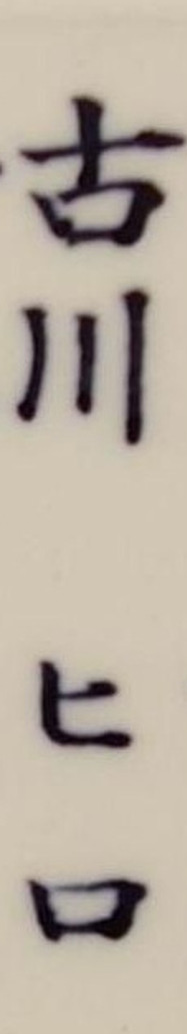古川ヒロ
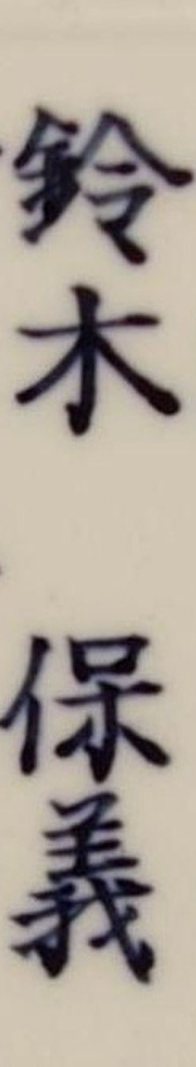鈴木保義
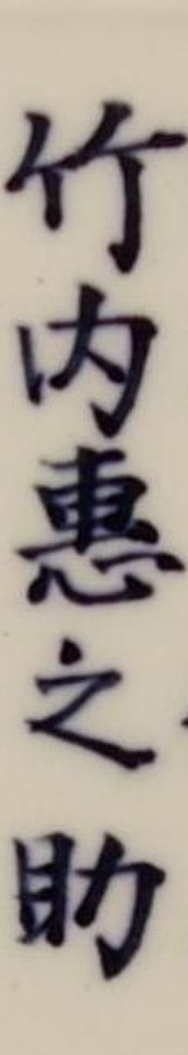竹内恵之助
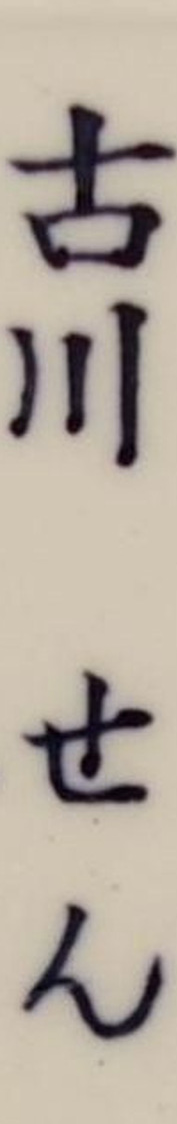古川せん
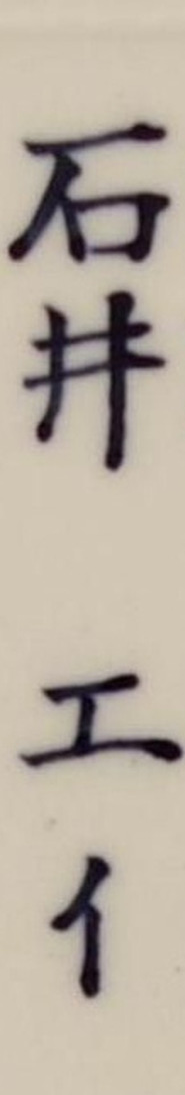石井エイ
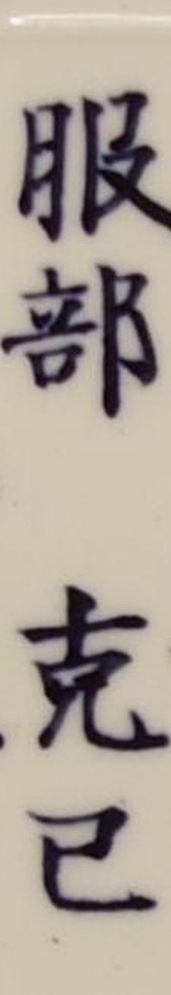服部克己
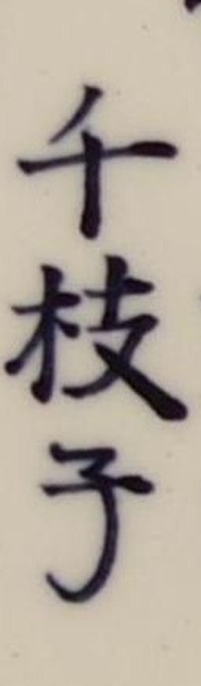千枝子
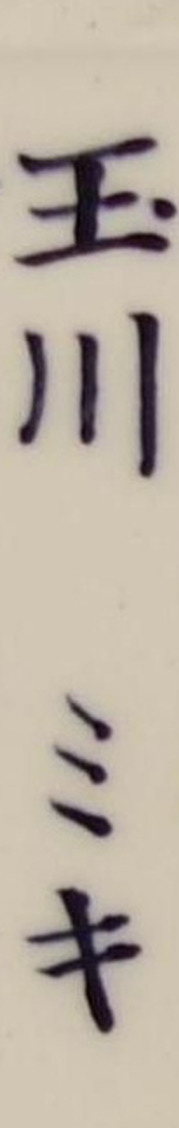玉川ミキ
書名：M~S
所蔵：高野山金剛峯寺
